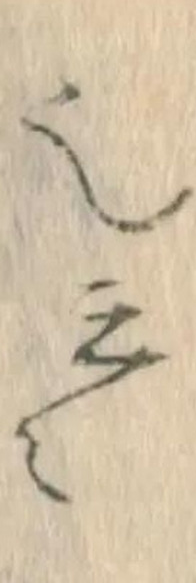也云々
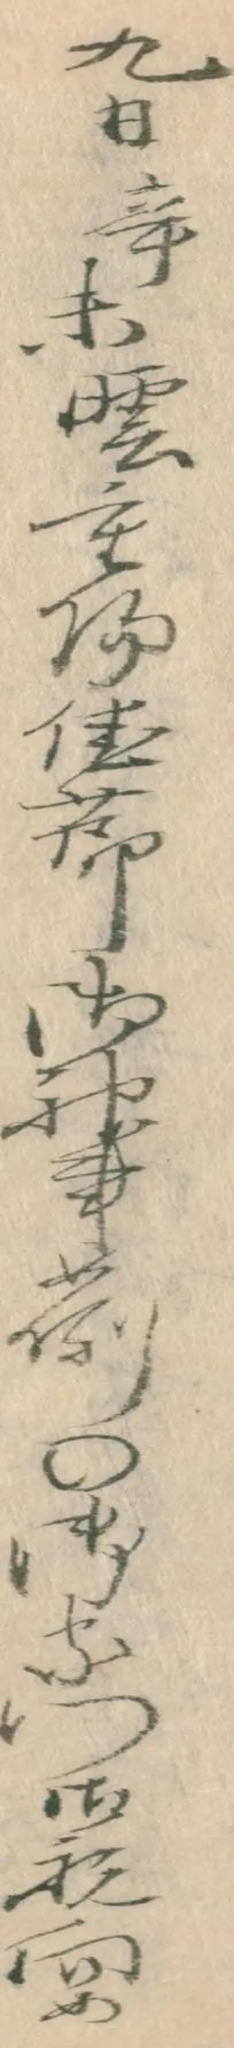九日辛未曇重陽佳節御神事如例〇御家門御祝向御
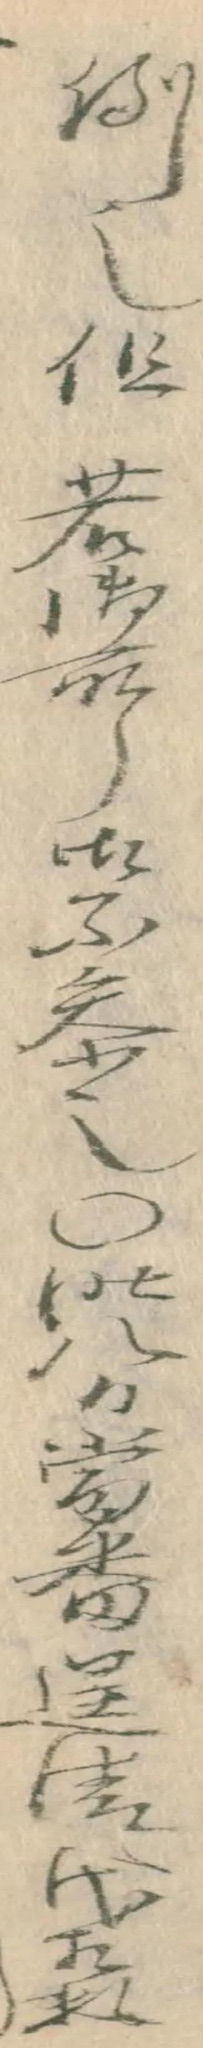例也但若御所御不参也○昨八日當番逞清代相頼了
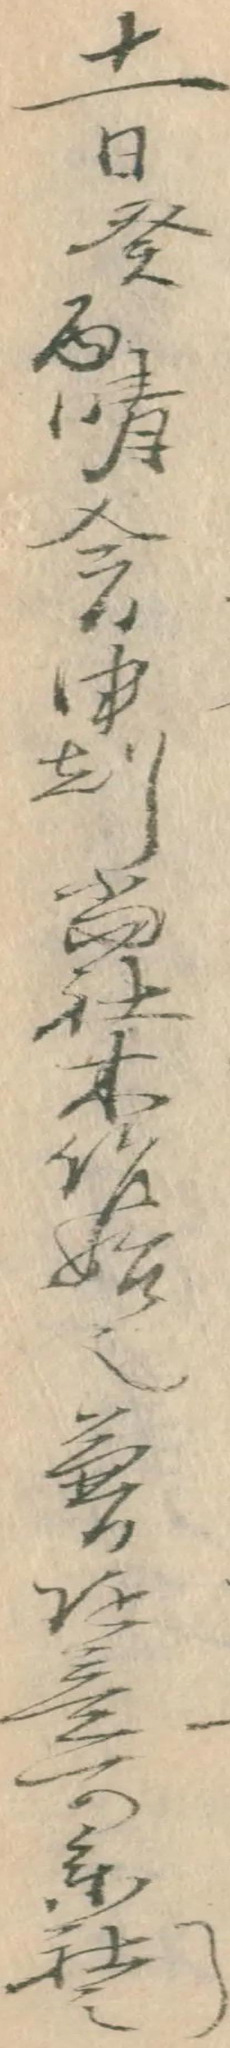十一日癸酉晴今日申刻當社木作始也兼日随意可参社之

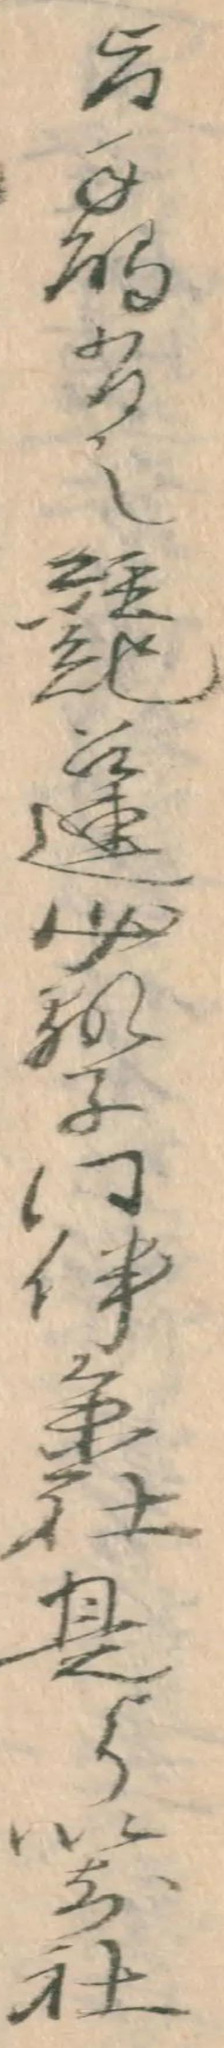旨手觸有之経紀召連必顕子同伴参社是より以前社
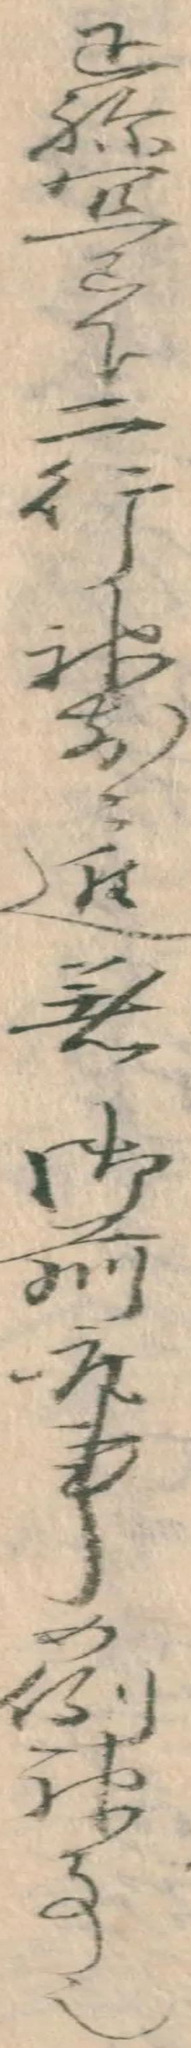正祢宜已下二行神前ニ進着御前取事如例神事也
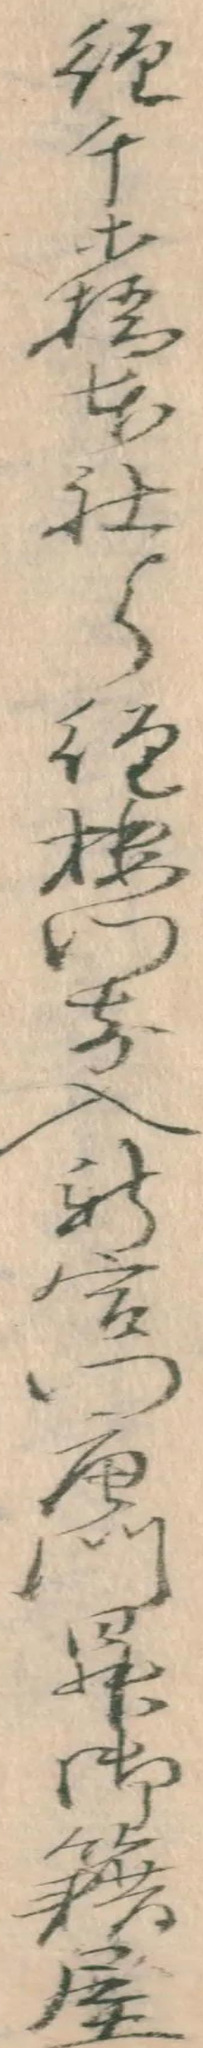経千等橋本社より経楼門前入新宮門唐門昇御籍屋
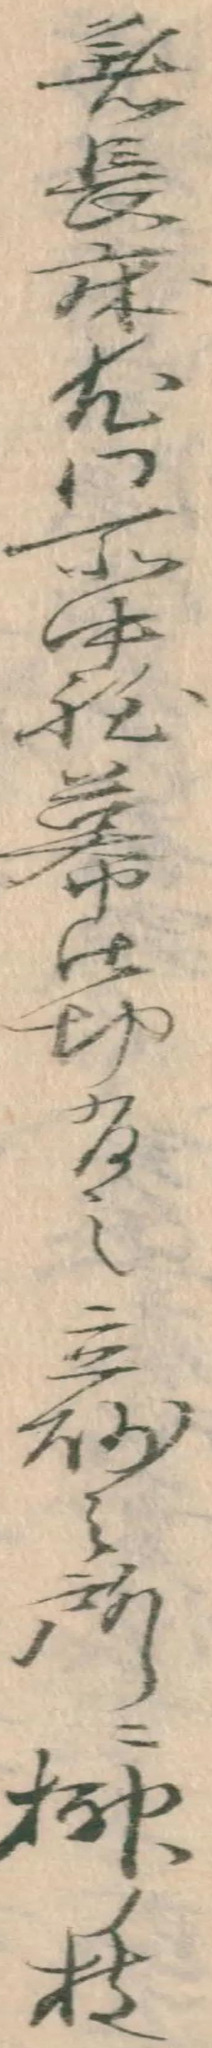着長床尤同所中程幕仕切有之立砂之所ニ榊ノ枝
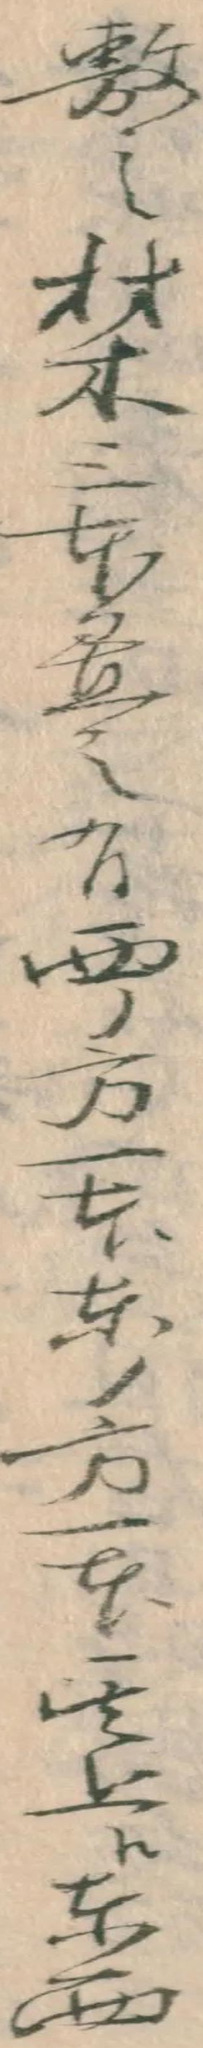敷也材木三本置之有西ノ方一本東ノ方一本其上え東西
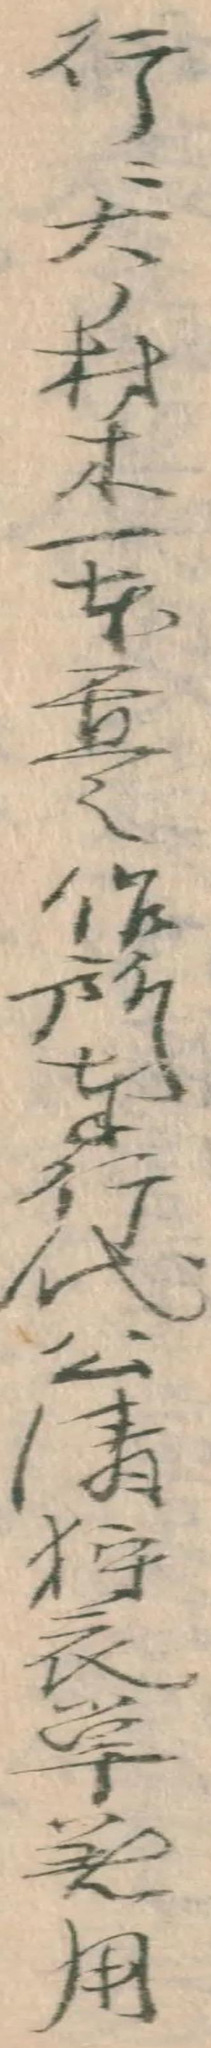行ニ大ノ材木一本置之作所奉行代公清狩衣単着用
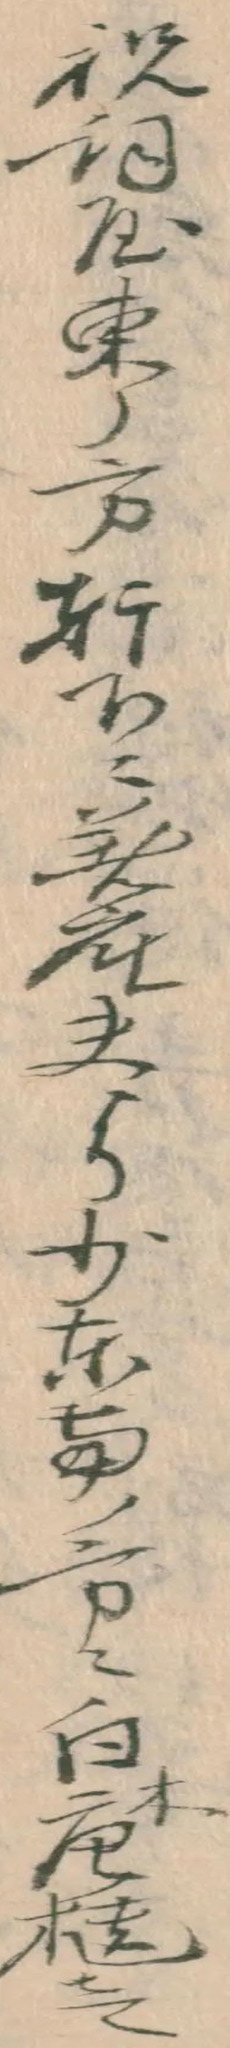祝詞屋東ノ方軒下ニ着座夫より少東南の方に白木唐櫃壱
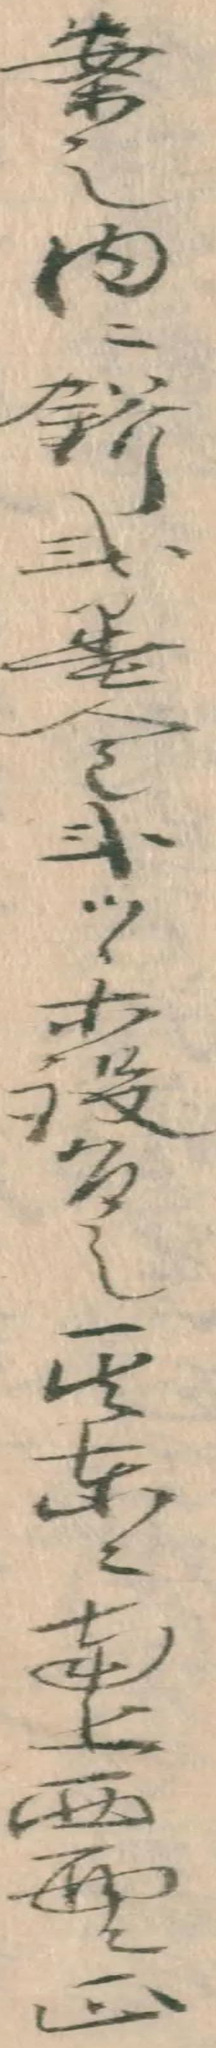案之内ニ釿弐墨金弐ツヽ等設有之其東ニ南上西西ニ正
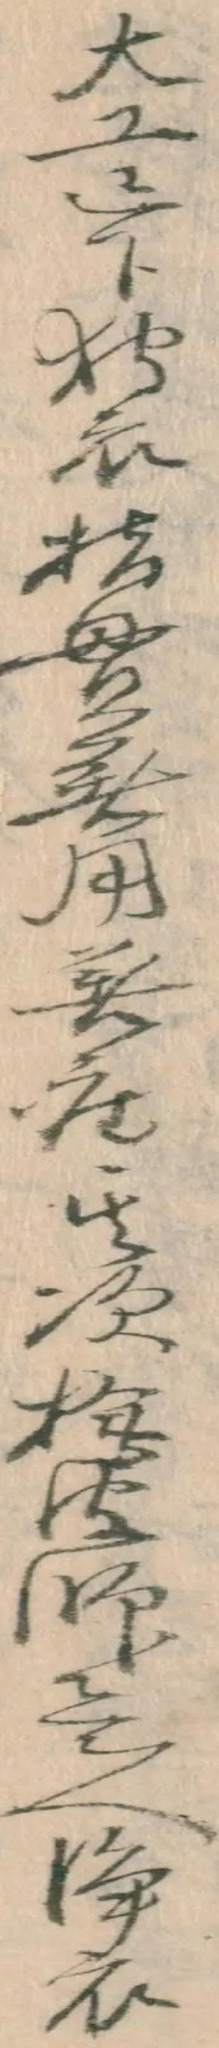大工已下狩衣指貫着用着座其次檜皮師壱人浄衣
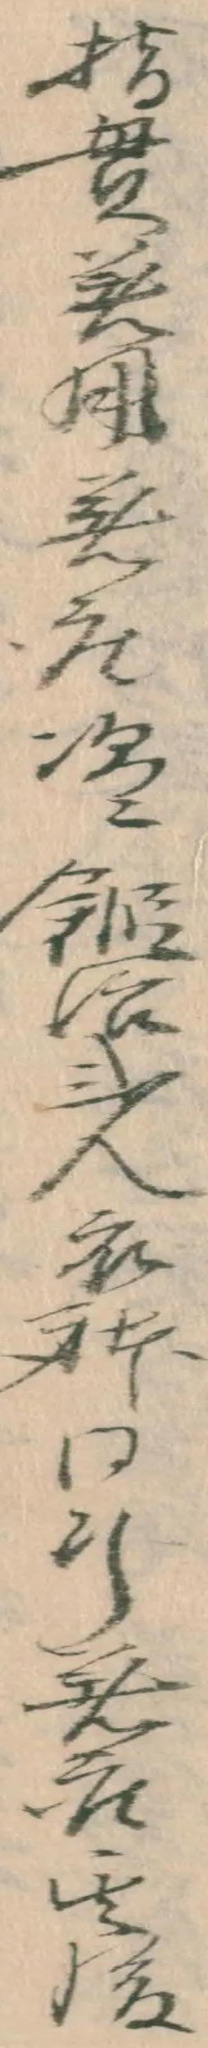指貫美用着座次ニ鍛冶弐人衣躰同断着座其後
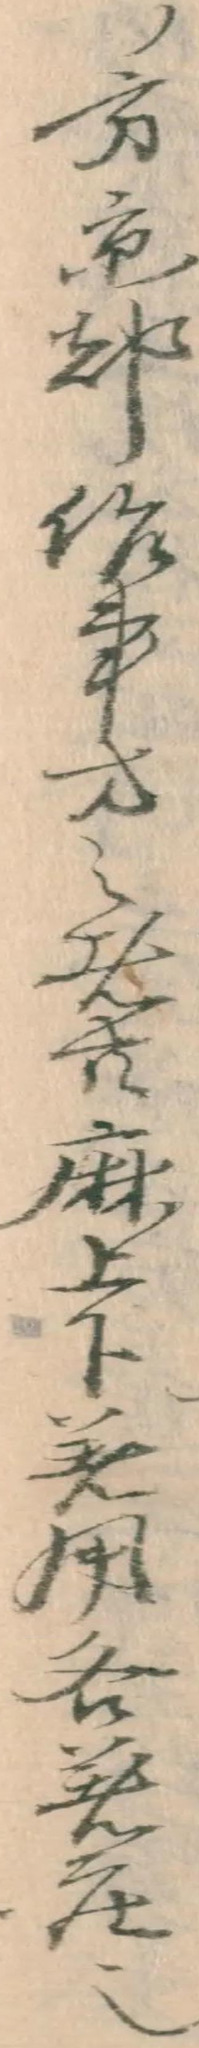ノ方京都作事方之者共麻上下着用各着座也
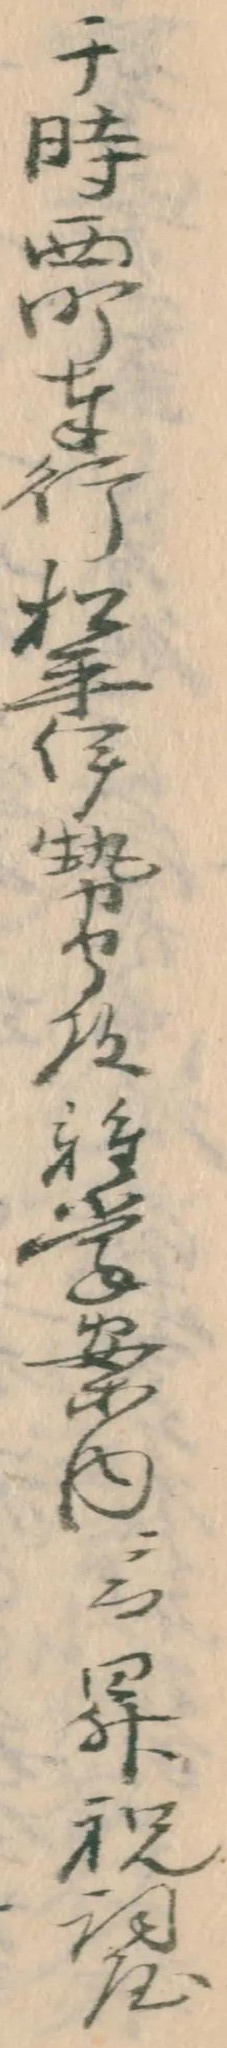于時西町奉行松平伊勢守殿雑掌案内ニ而昇祝詞屋
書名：賀茂社記録. 第66冊
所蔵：国立国会図書館 National Diet Library, JAPAN
